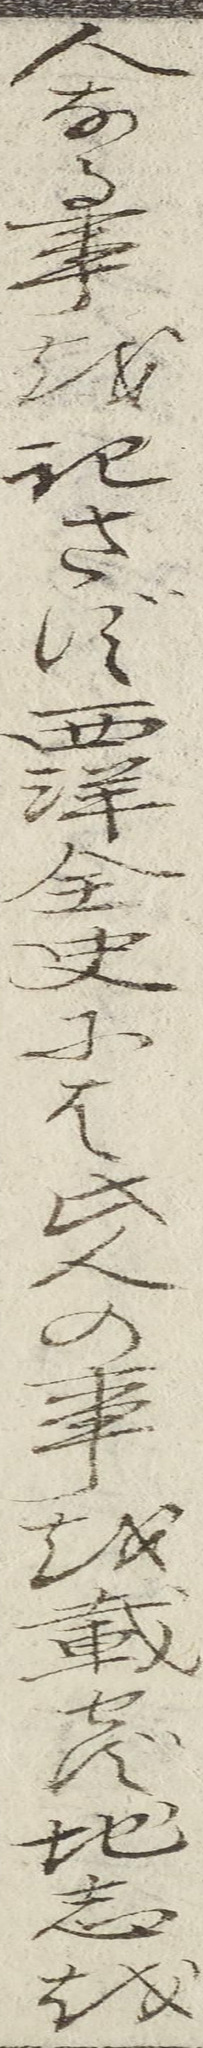人なる事を記さず西洋全史には此人の事を載せず地志を
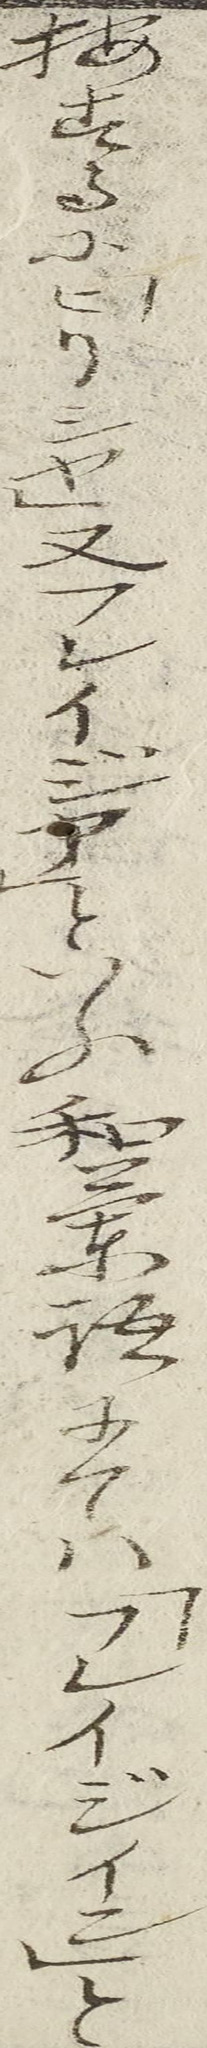按するに「ヒリシヤ」又フレイジア」といふ和蘭語にては「フレイジイン」と
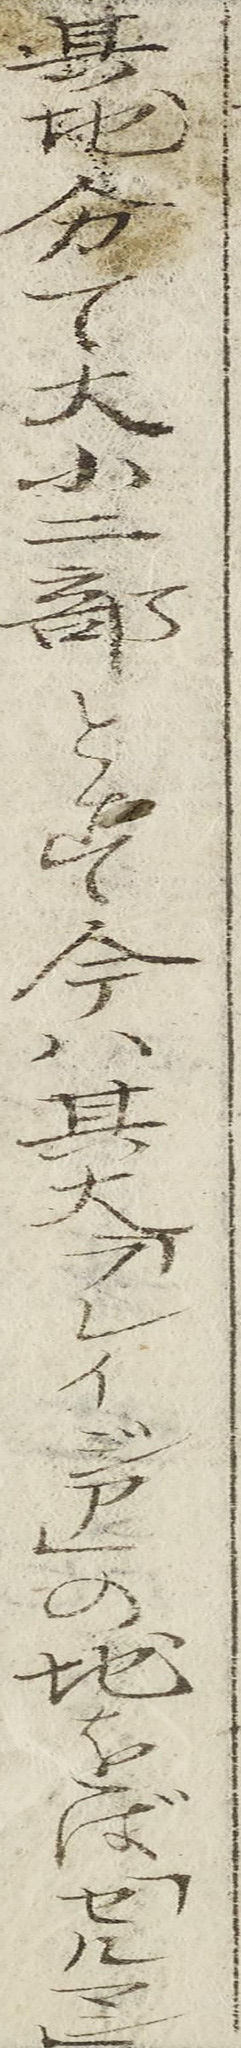其地分て大小二部とす今は其大「フレイジア」の地をば「セルマ」
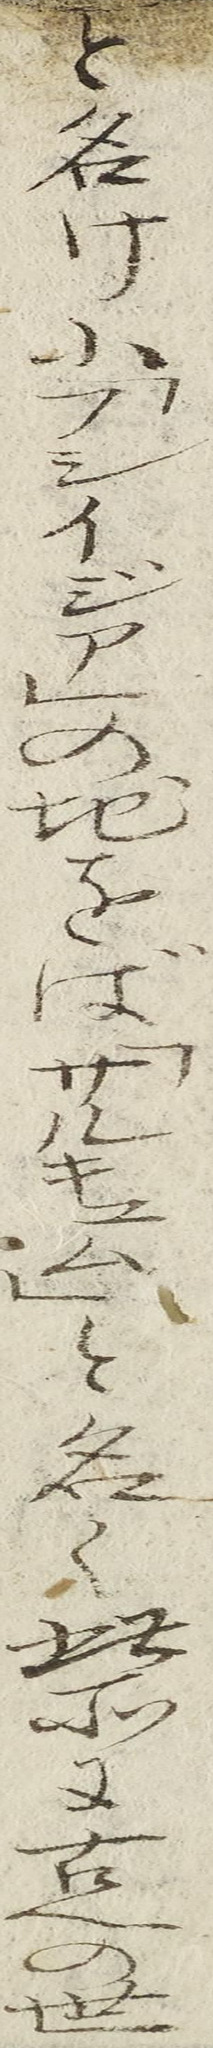と名け小「フレイジア」の地をば「サルキュム」と名く此所に古への世
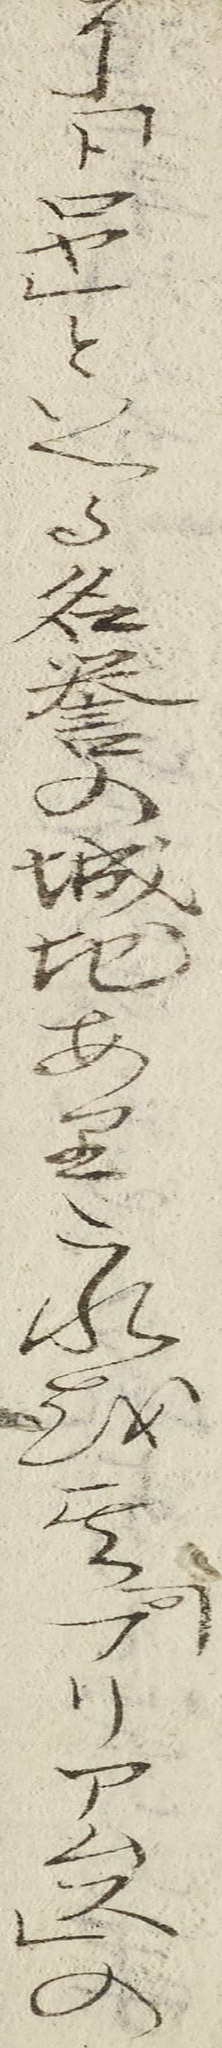に「トロヤ」といへる名誉の城地ありこれを其「プリアムス」の
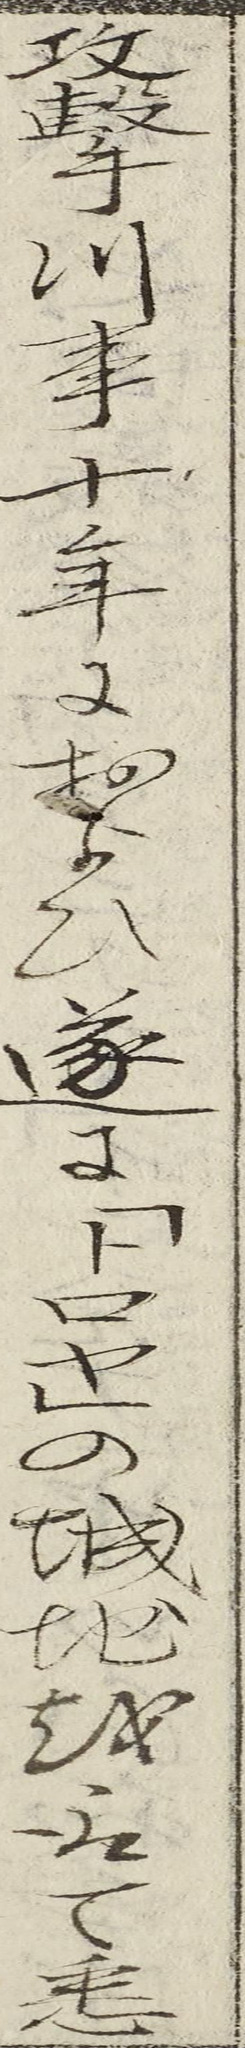攻撃つ事十年におよひ遂に「トロヤ」の城地を占て悉
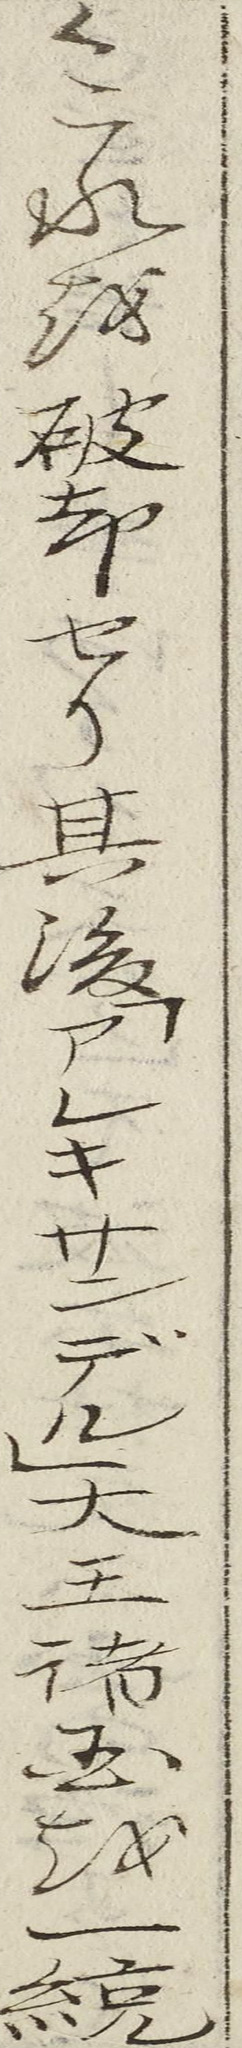くこれを破却せり其後「アレキサンデル」大王諸国を一統
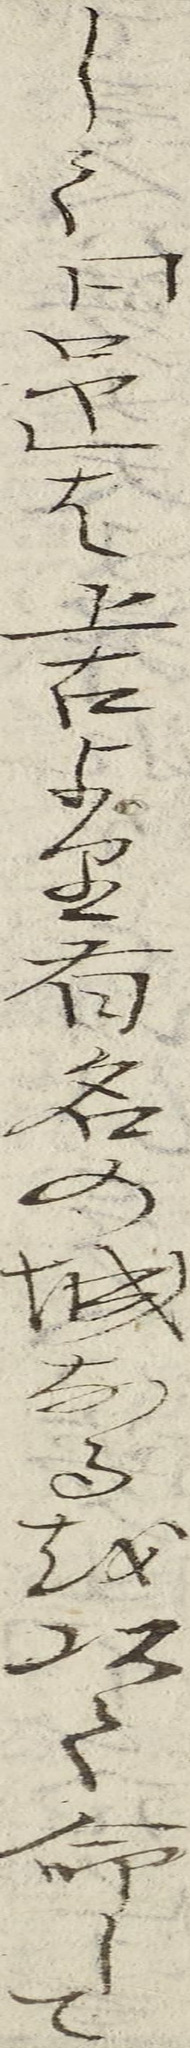して「トロヤ」は上古より有名の城なるを以て命して
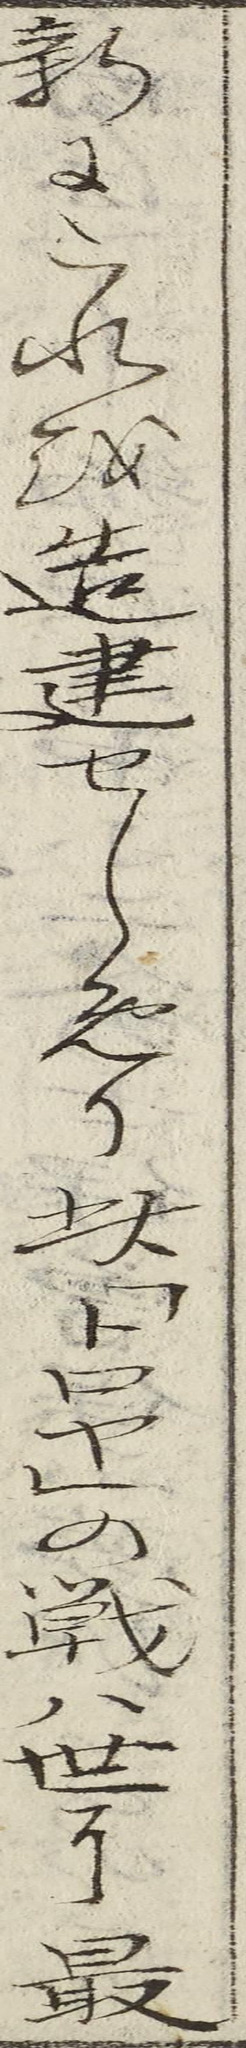新にこれを造建せしめり此「トロヤ」の戦は世に最
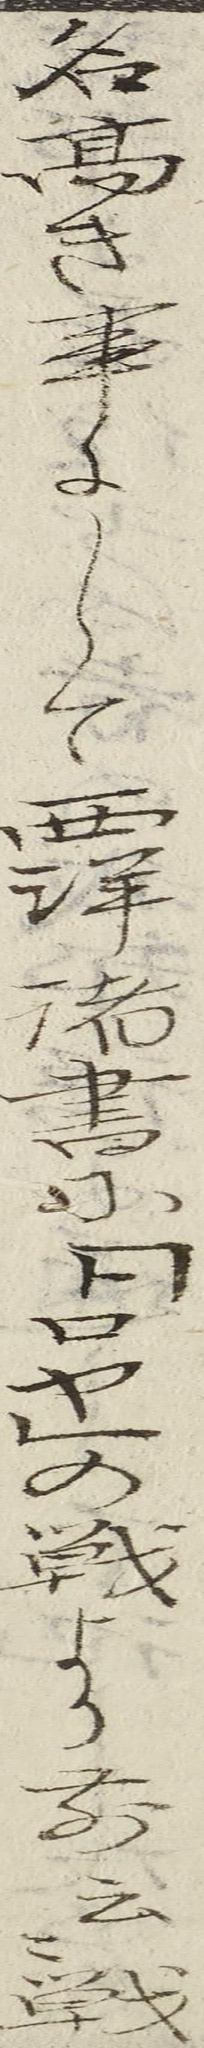名高き事にして西洋諸書に「トロヤ」の戦より前云〻戦
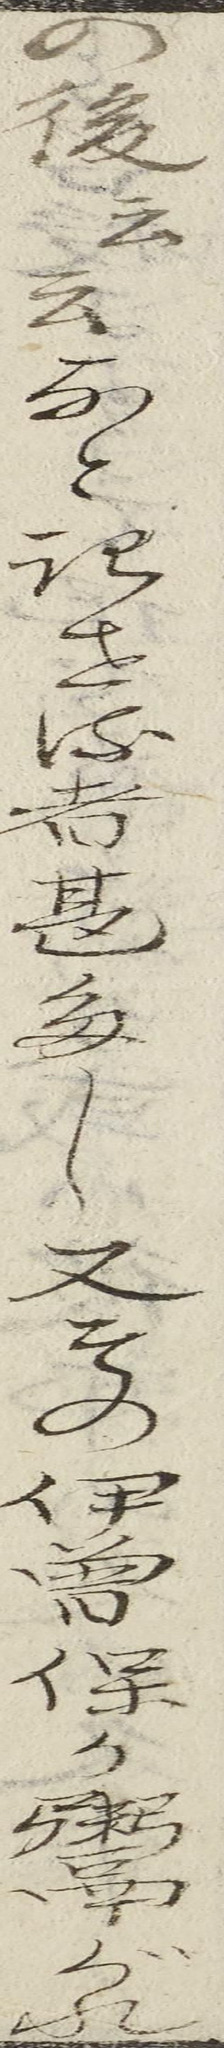の後云云なと記せる者甚多し又その伊曽保か鬻がれ
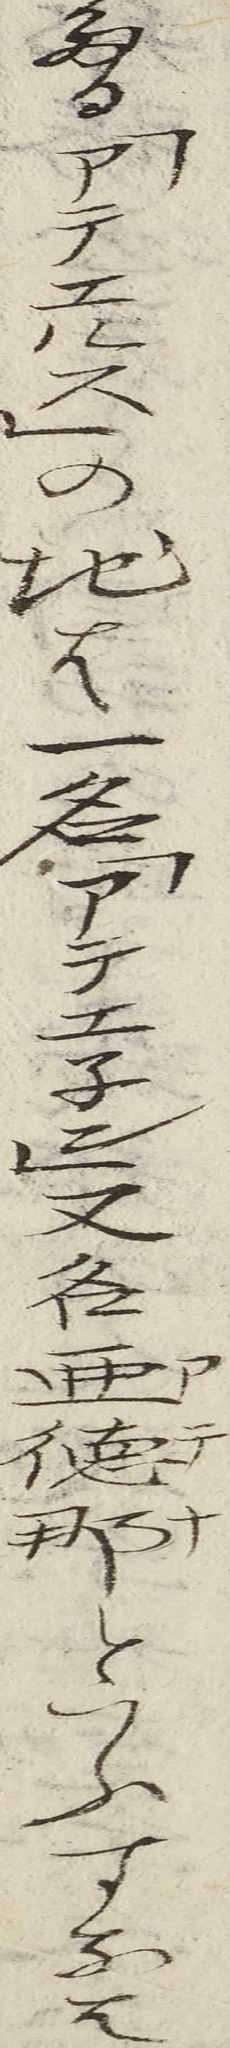たる「アテエルス」の地は一名「アテエネン」又名亜徳那といふすなは
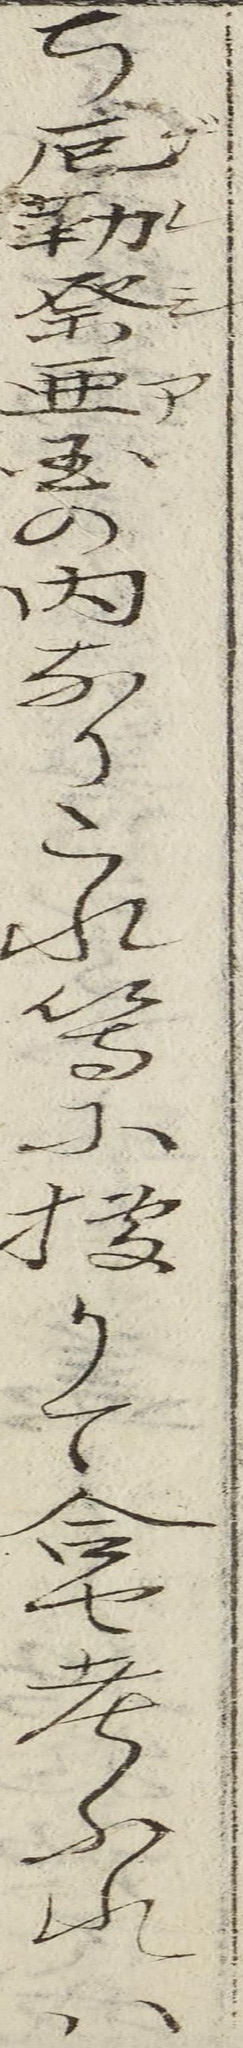ち厄勒祭亜国の内なりこれ等に拠りて合せ考ふれは
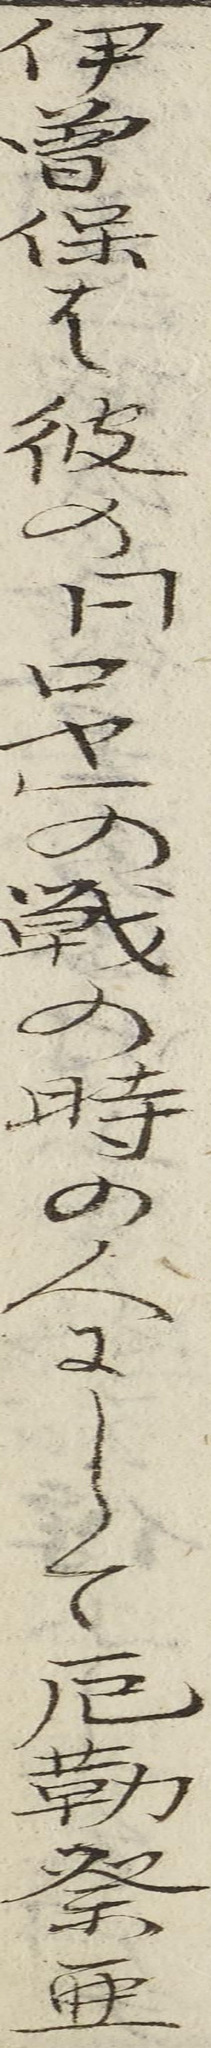伊曽保は彼の「トロヤ」の戦の時の人にして厄勒祭亜

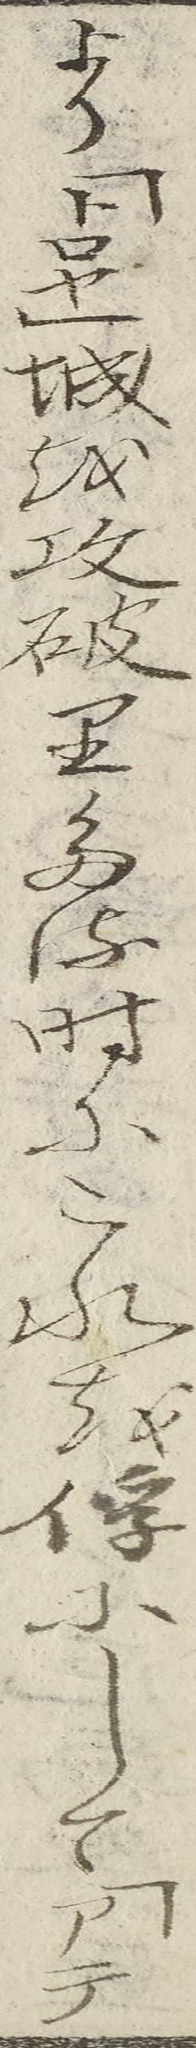より「トロヤ」城を攻破りたる時にこれを俘にして「アテ
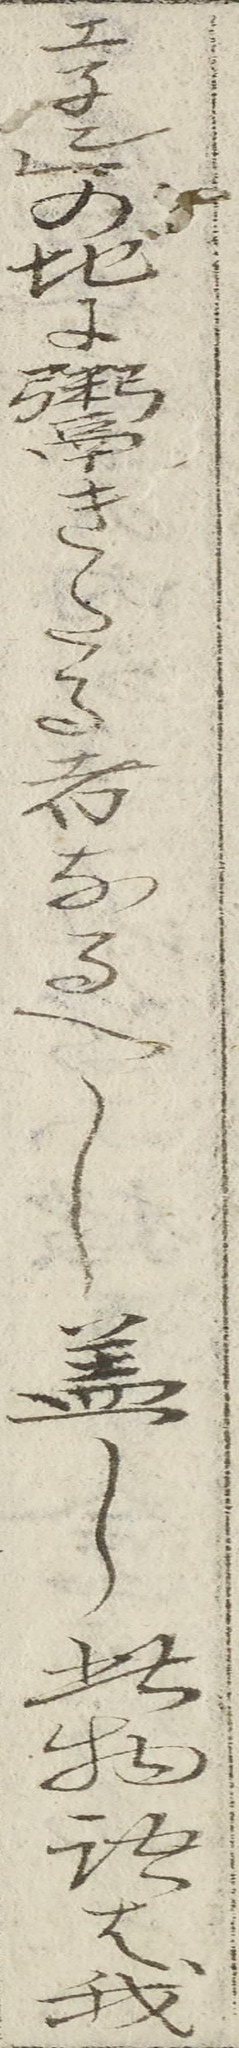エネン」の地に鬻きたる者なるへし蓋し此物語は我
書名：西洋雜記　乾
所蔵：東京大学地震研究所図書室 Earthquake Research Institute Library, The University of Tokyo, JAPAN
